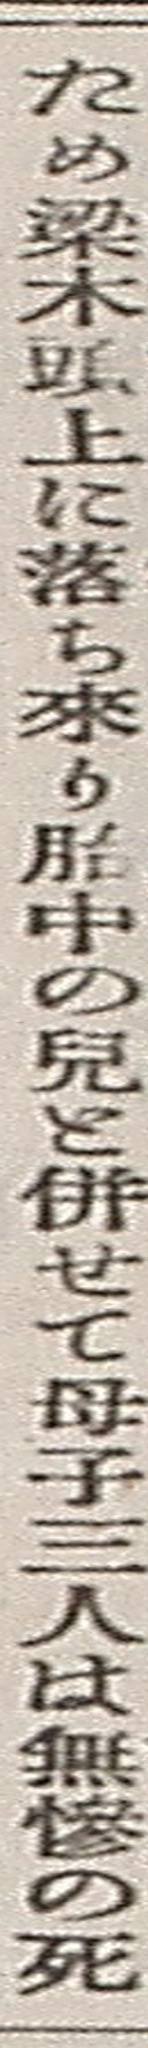ため梁木頭上に落ち来り胎中の児と併せて母子三人は無残の死
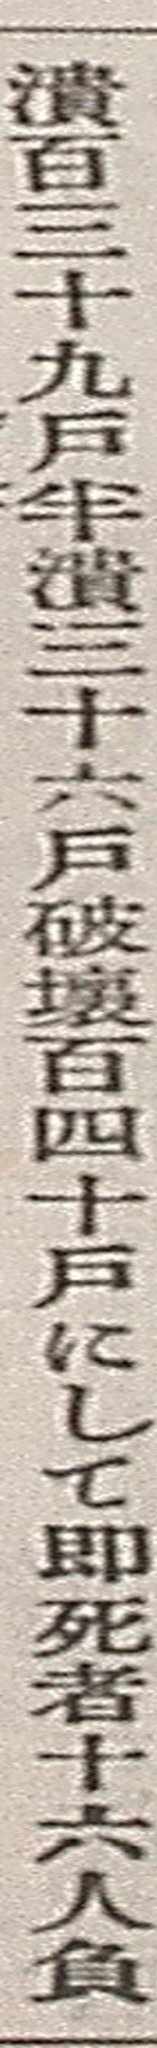潰百三十九戸半潰三十六戸破壊百四十戸にして即死者十六人負
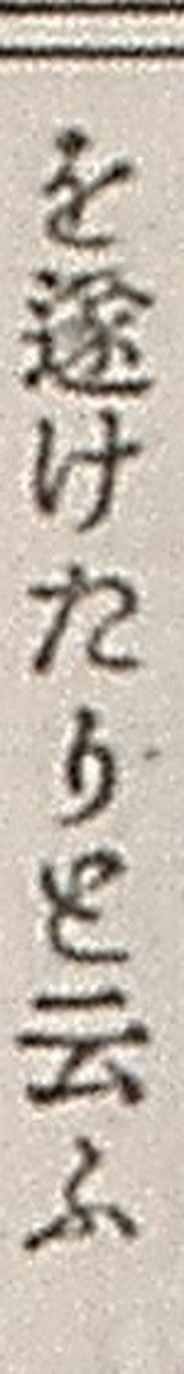を遂けたりと云ふ
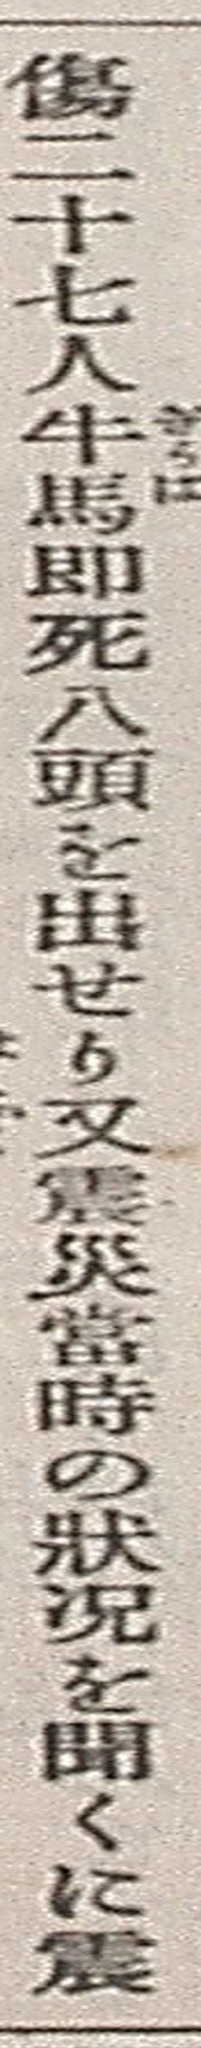傷二十七人牛馬即死八頭を出せり又震災当時の状況を聞くに震
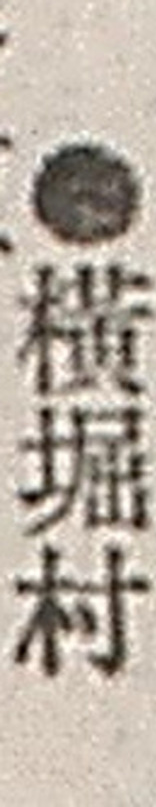●横堀村
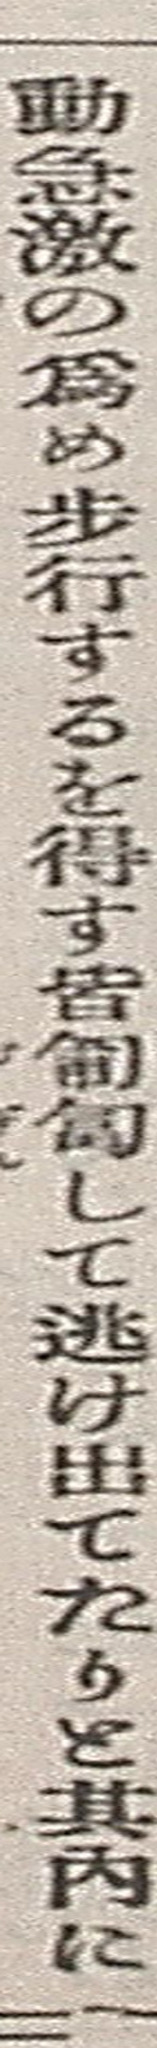動急激の為め歩行するを得す皆匍匐して逃け出てたりと其内に
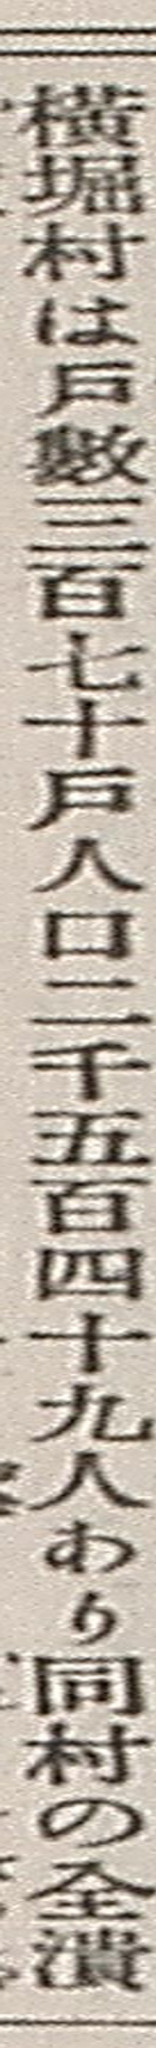横堀村は戸数三百七十戸人口二千五百四十九人あり同村の全潰
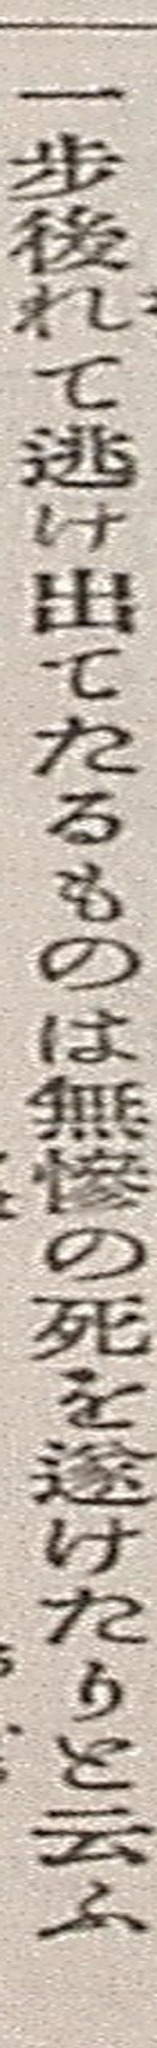一歩後れて逃け出てたるものは無惨の死を遂けたりと云ふ
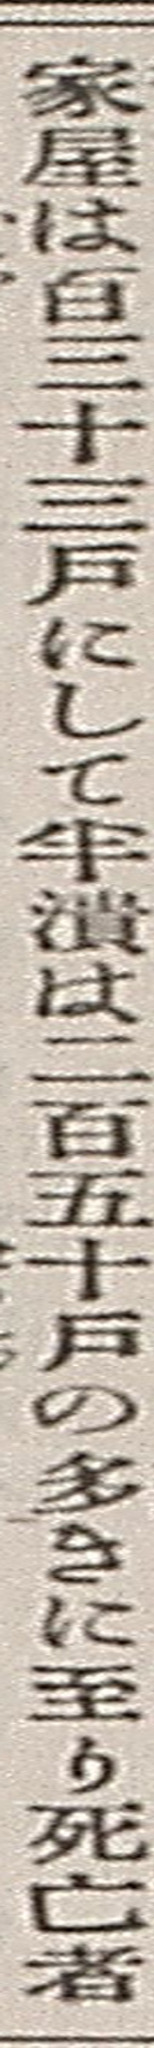家屋は百三十三戸にして半潰は二百五十戸の多きに至り死亡者
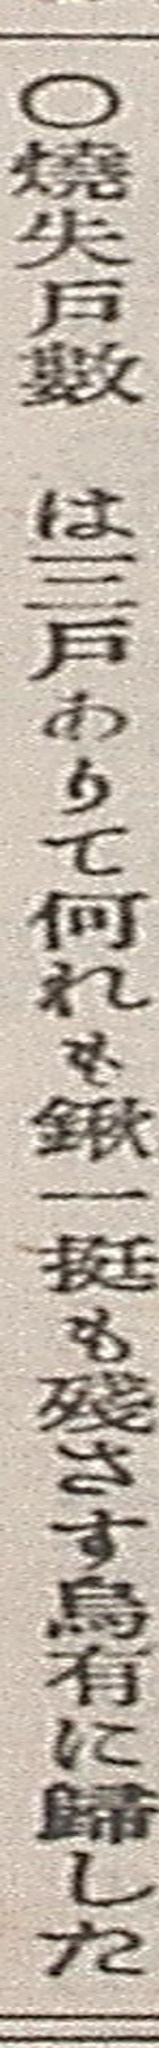〇焼失戸数は三戸ありて何れも鍬一挺も残さす鳥有に帰した
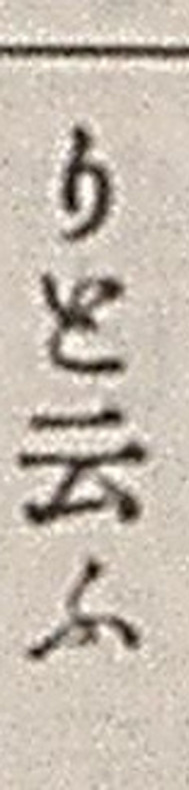りと云ふ
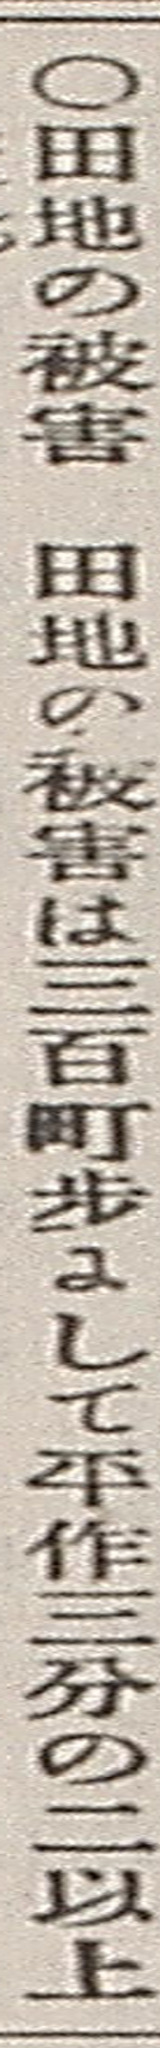〇田地の被害田地の被害は三百町歩にして平作三分の二以上
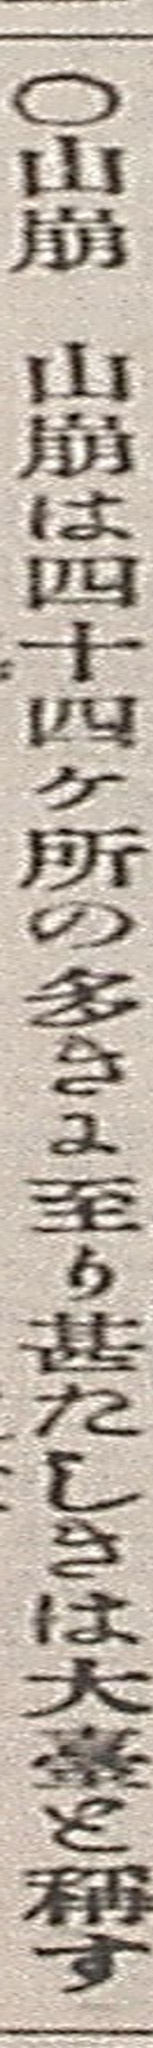〇山崩山崩は四十四ケ所の多きに至り甚たしきは大台と称す
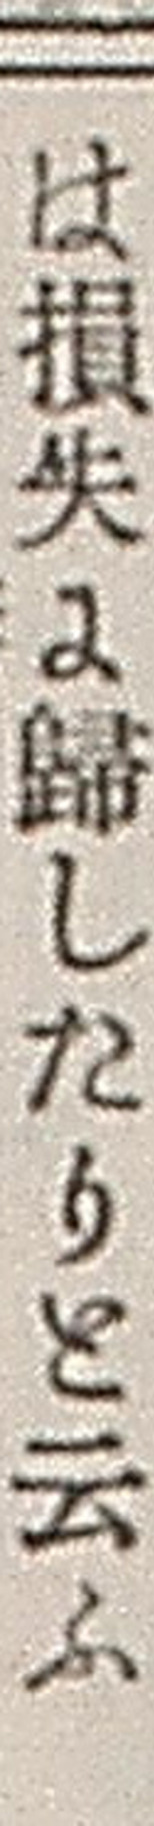は損失に帰したりと云ふ
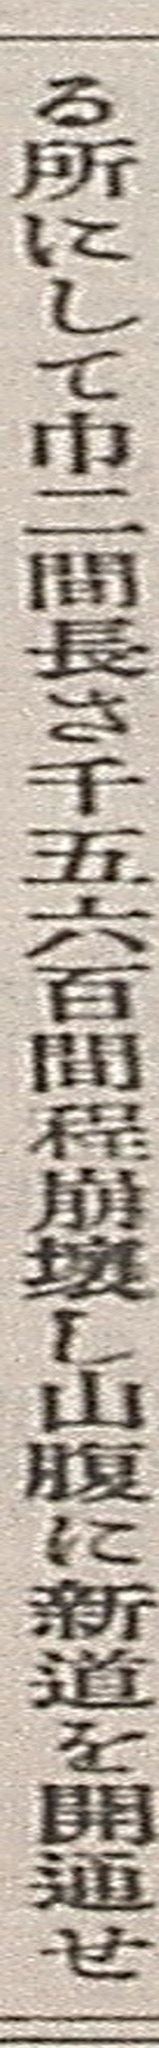る所にして巾二間長さ千五六百間程崩壊し山腹に新道を開通せ
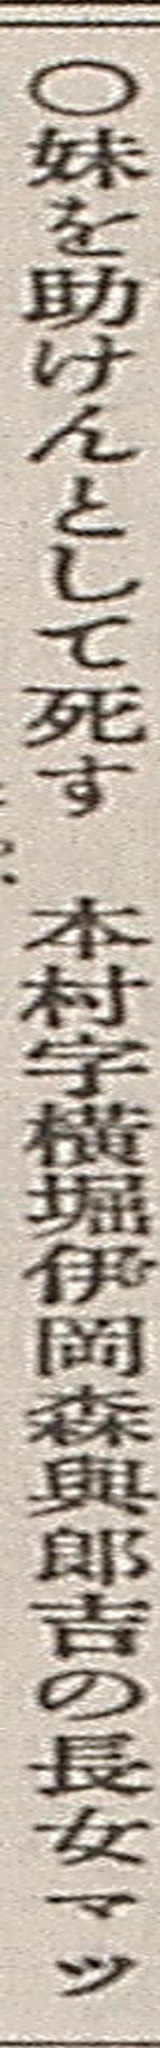〇妹を助けんとして死す本村字横堀伊岡森与郎吉の長女マツ
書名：風俗畫報臨時増刊第百二十四號　洪水地震被害録（上）
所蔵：東京大学地震研究所図書室 Earthquake Research Institute Library, The University of Tokyo, JAPAN
